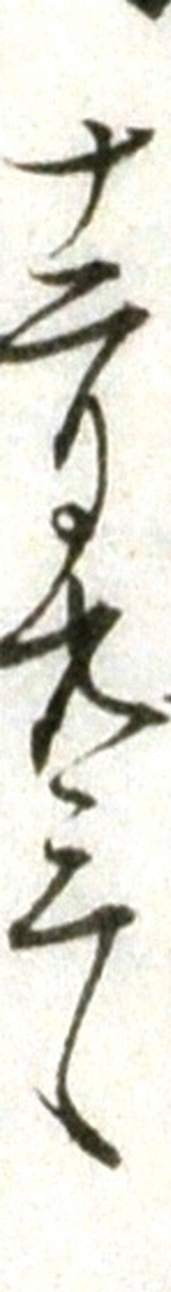十二月廿三日
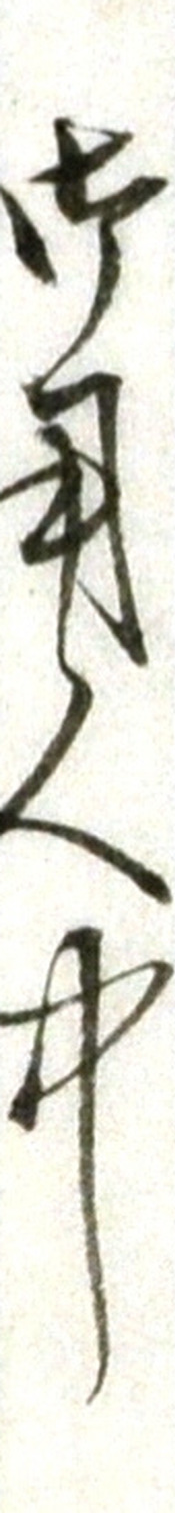御用人中
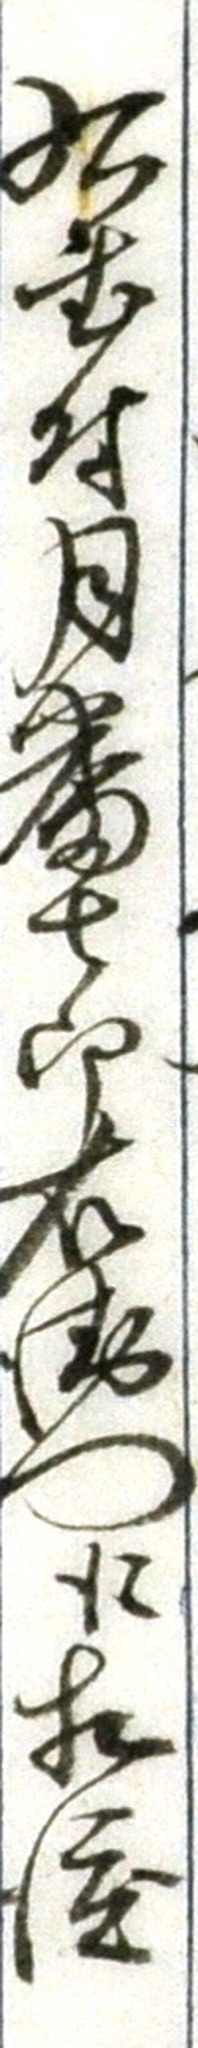右書付月番七郎右衛門江相渡
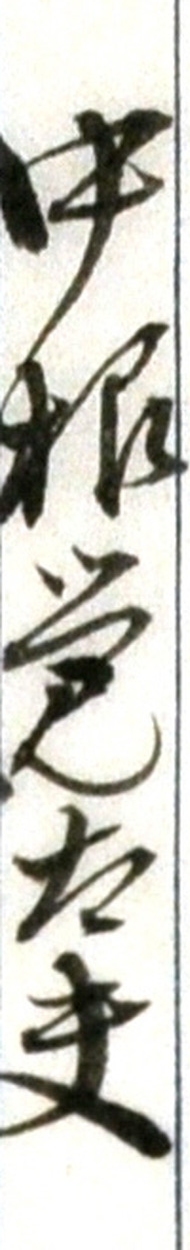中根覚太夫
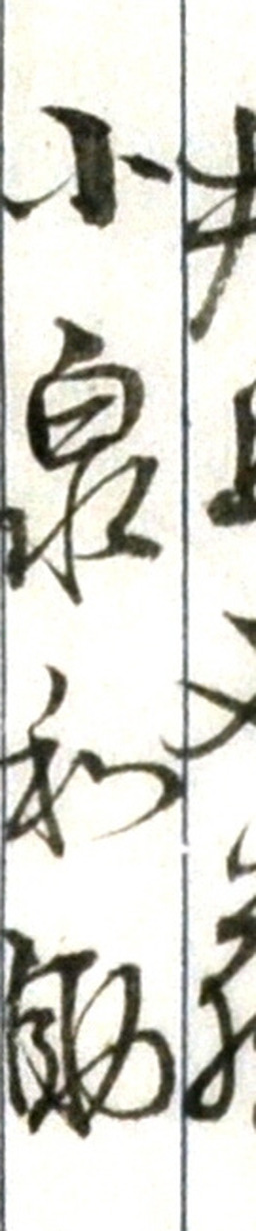小泉和助
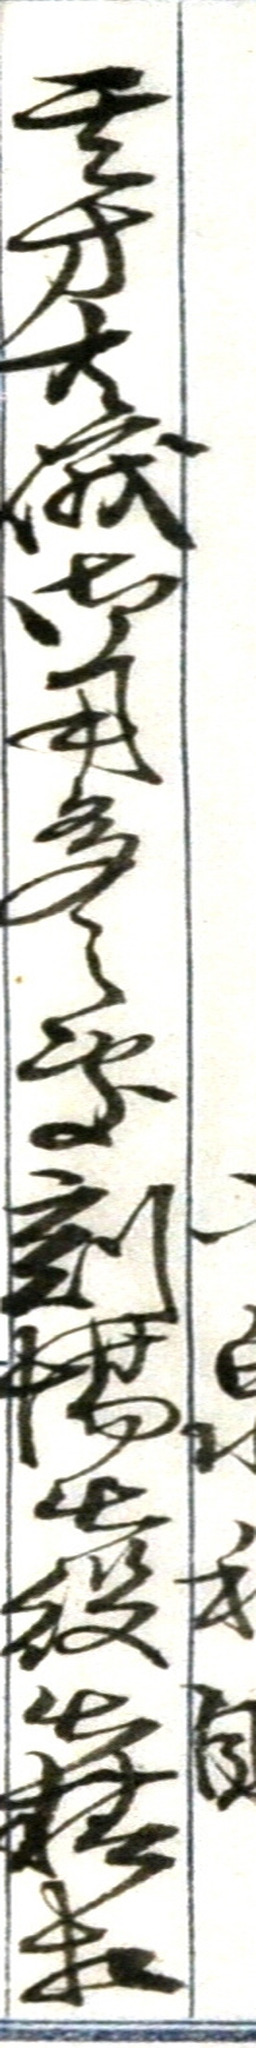其方共儀御用多之處刻場出役出精相

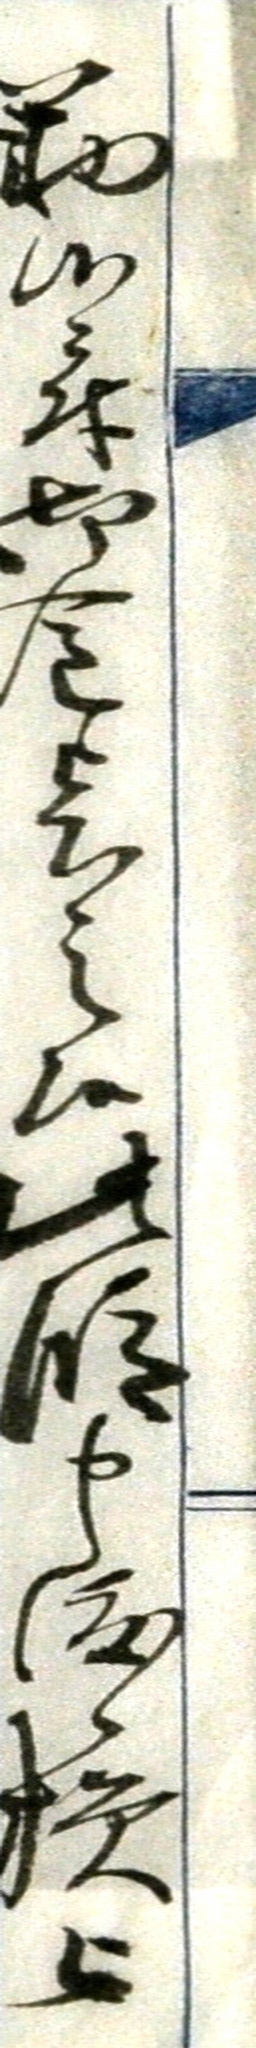勤候ニ付御金被下之候此段申渡候様被
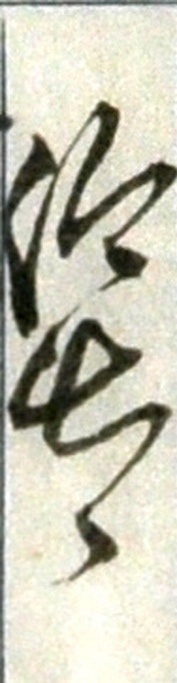仰出候
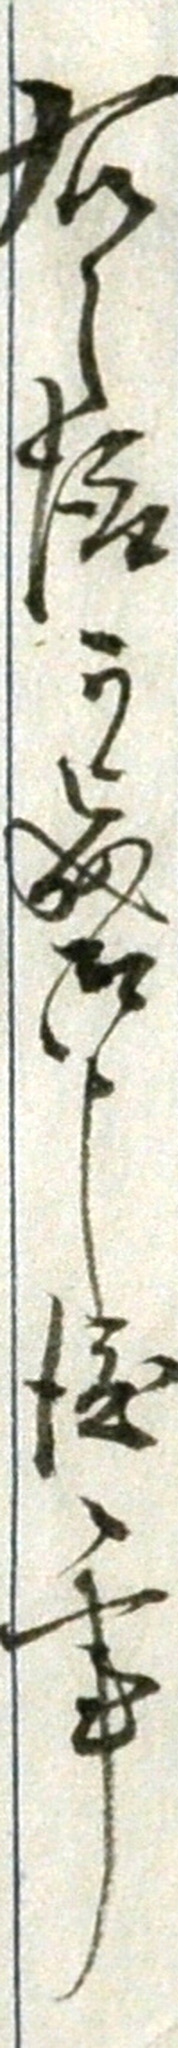右之趣可被成御申渡候事
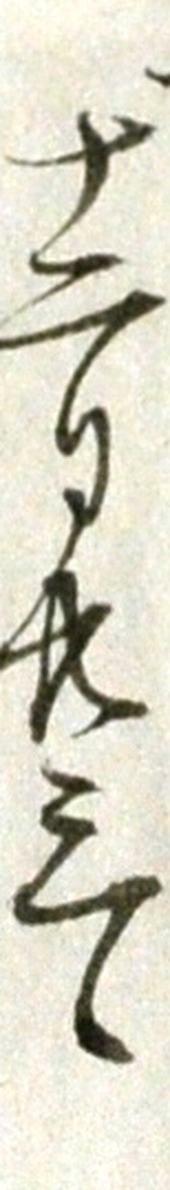十二月廿三日
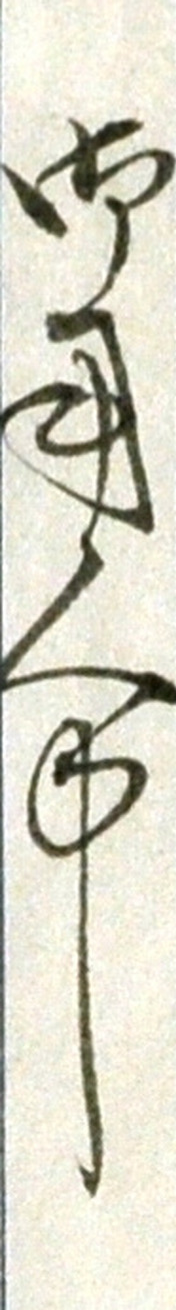御用人中
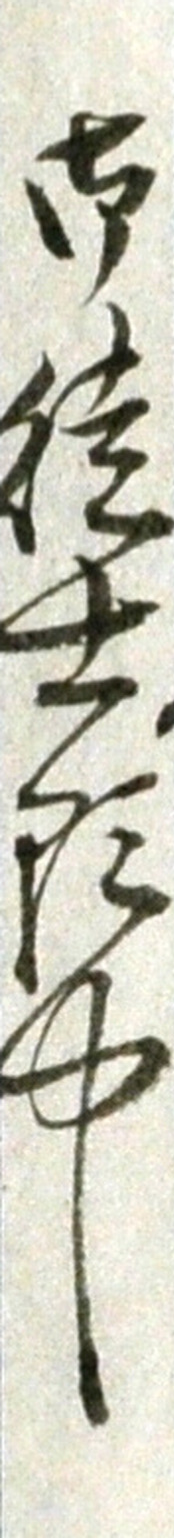御徒士頭中
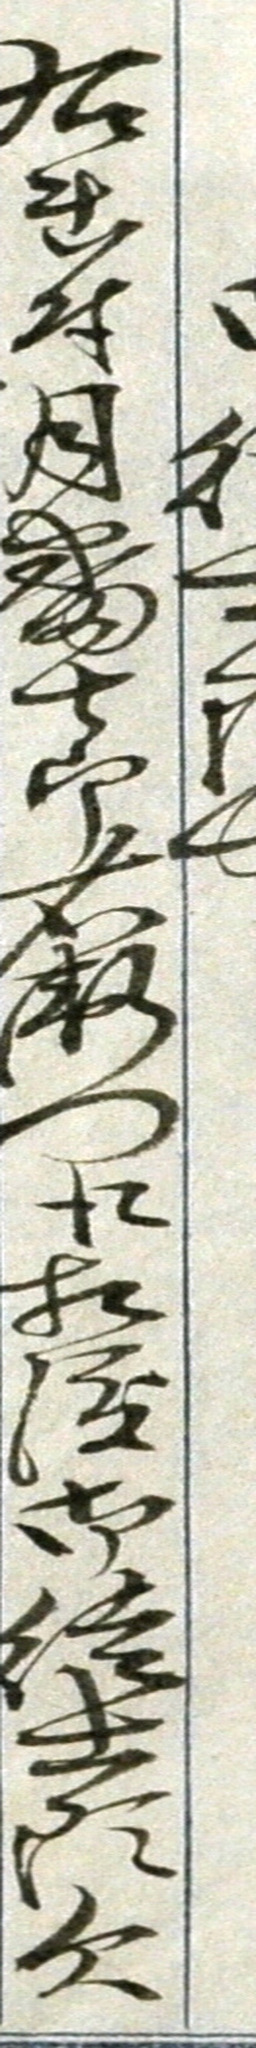右書付月番七郎右衛門江相渡御徒士頭欠
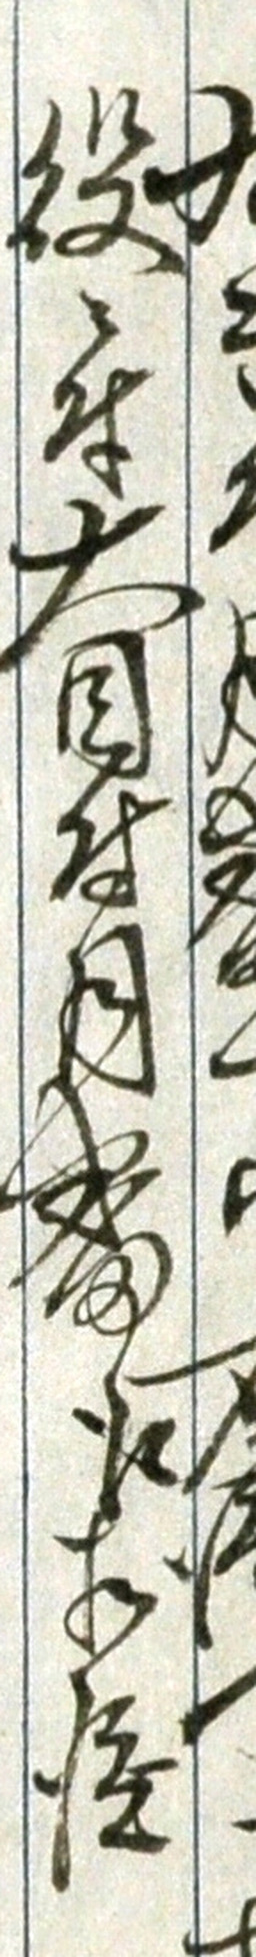役ニ付大目付月番江相渡
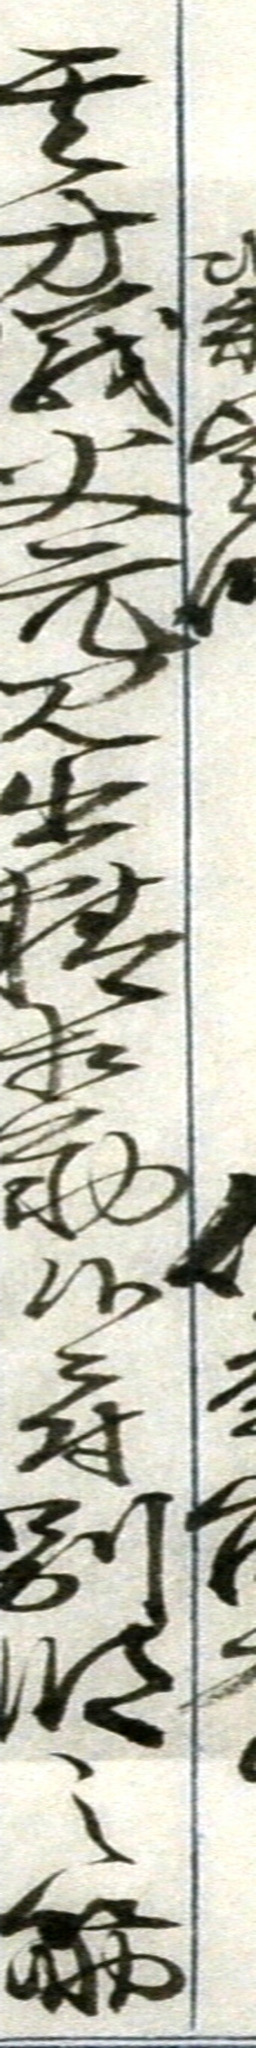其方儀火元見出精相勤候ニ付別段之筋
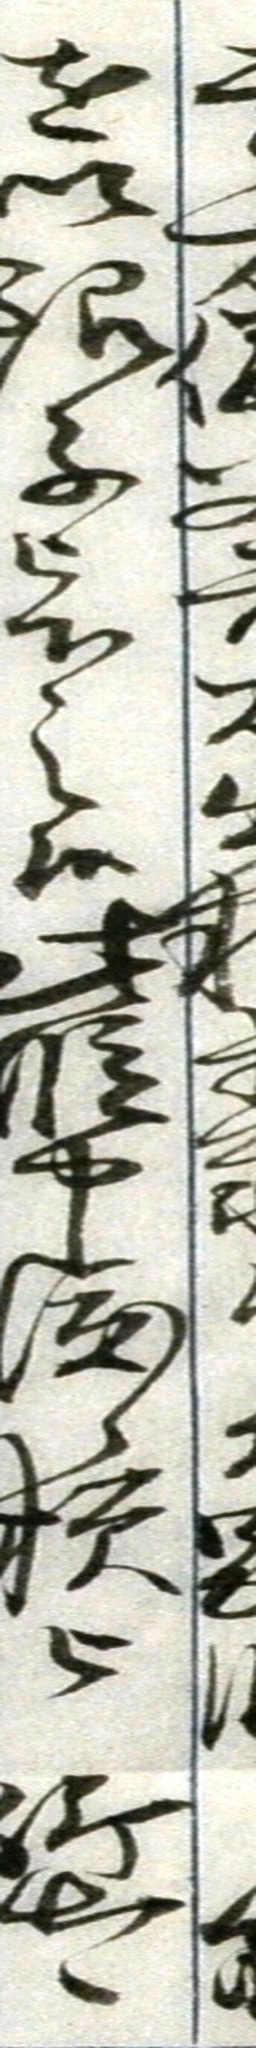を以銀子被下之候此段申渡候様被仰出候
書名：上方ヨリ御帰府之後江戸勤并江戸在番中之者江被下・控
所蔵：伊那市立高遠町図書館・合同会社AMANE
